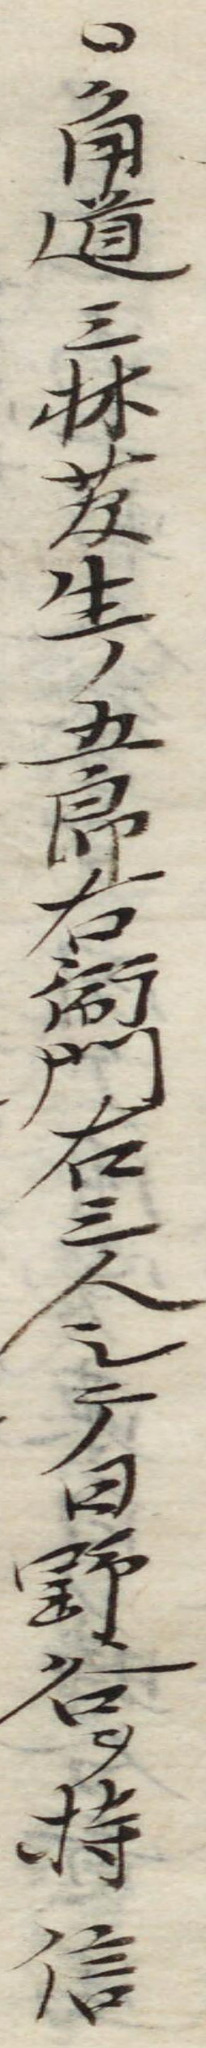〇角道三林笈生ノ五郎右衛門右三人シテ日野谷ヲ持信
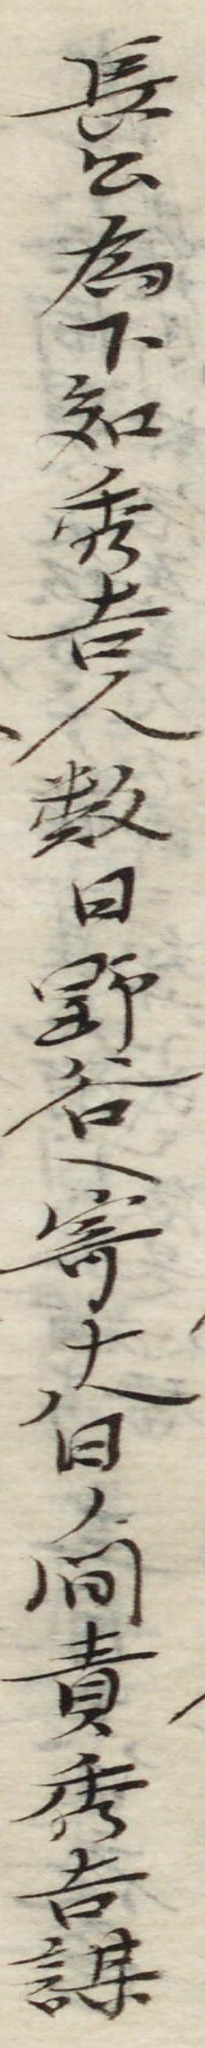長公為下知秀吉人数日野谷へ寄十八日ノ間責秀吉謀
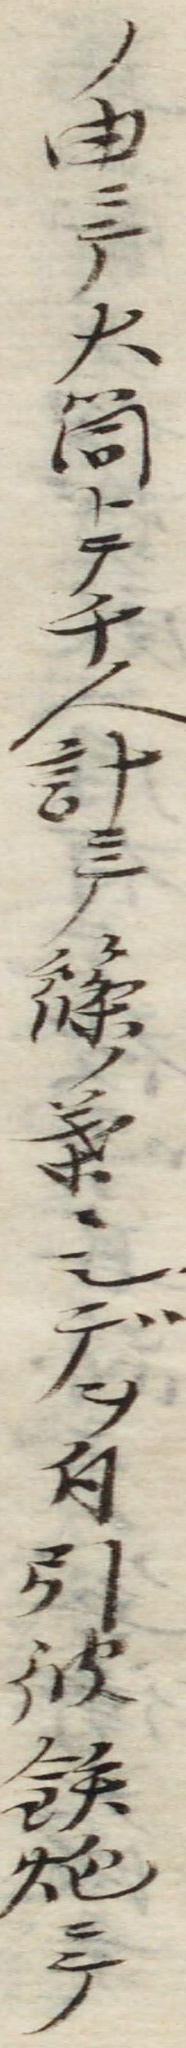ノ由ニテ大筒トテ千人計ニテ篠ノ葉シデヲ自引彼鉄炮ニテ
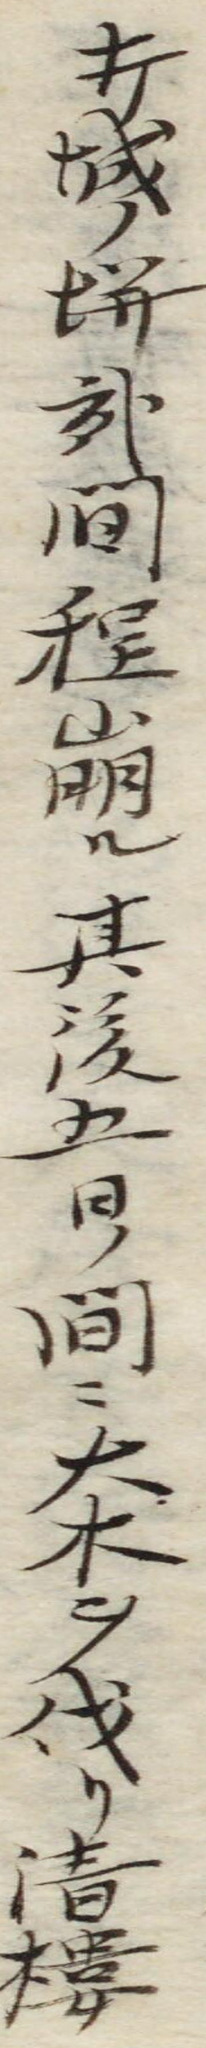打城ノ塀弐間程崩ル其後五日ノ間ニ大木ヲ伐リ清楼
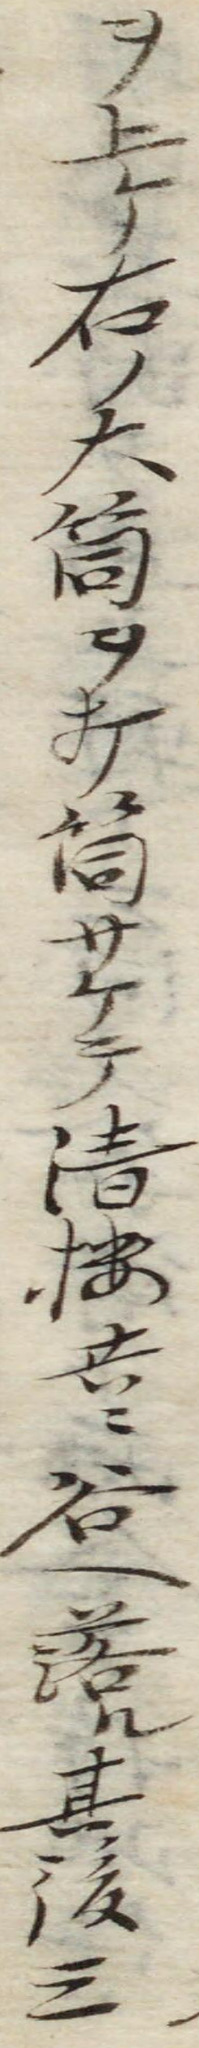ヲ上ヶ右ノ大筒ヲ打筒サケテ清楼共ニ谷へ落ル其後三
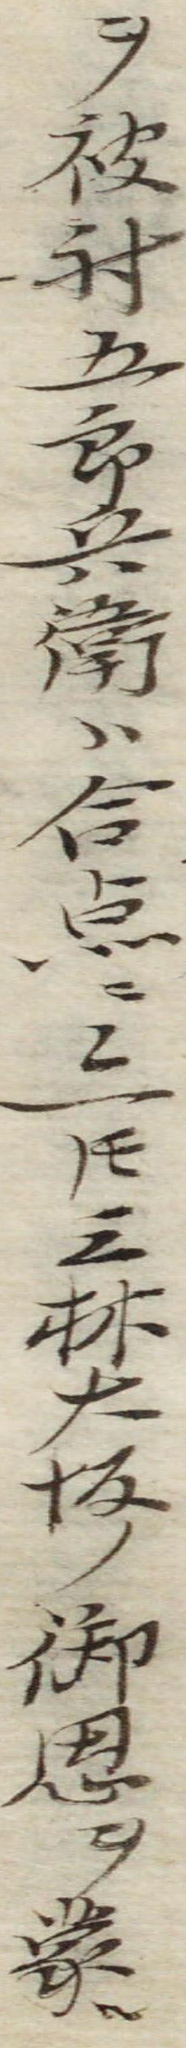ヲ被射五郎兵衛ハ合点ニ候へトモ三林大坂ノ御恩ヲ蒙ル
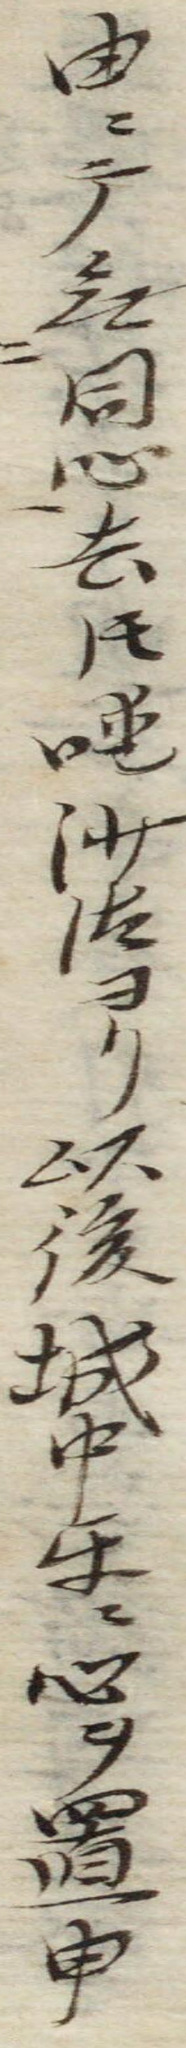由ニテ無同心去トモヨリ以後城中東ニ心ヲ置申

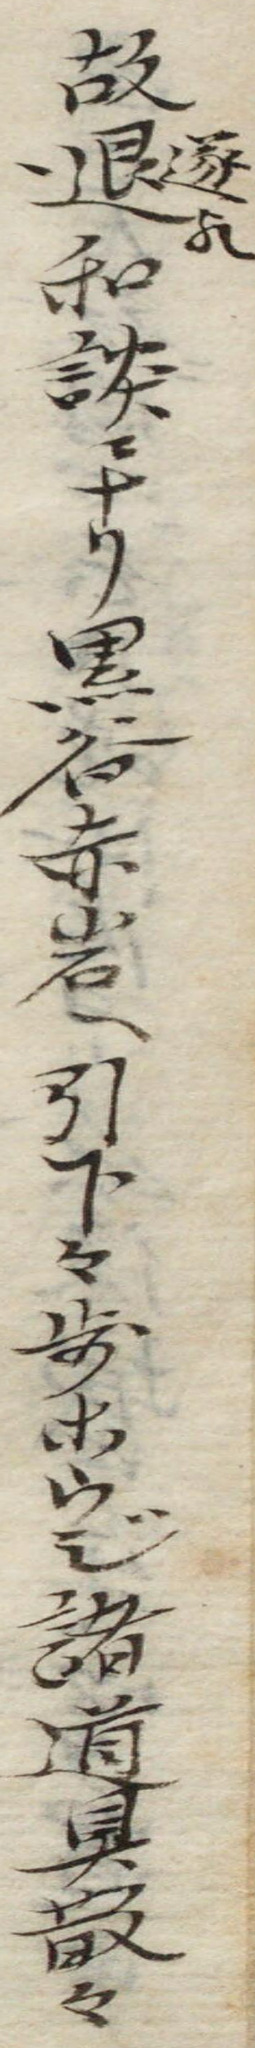故退和談ニナリ黒谷赤岩ヘ引下々歩ホウジ諸道具散々
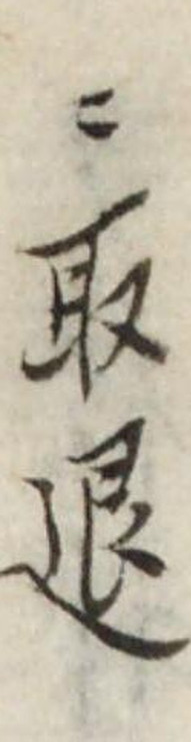ニ取退
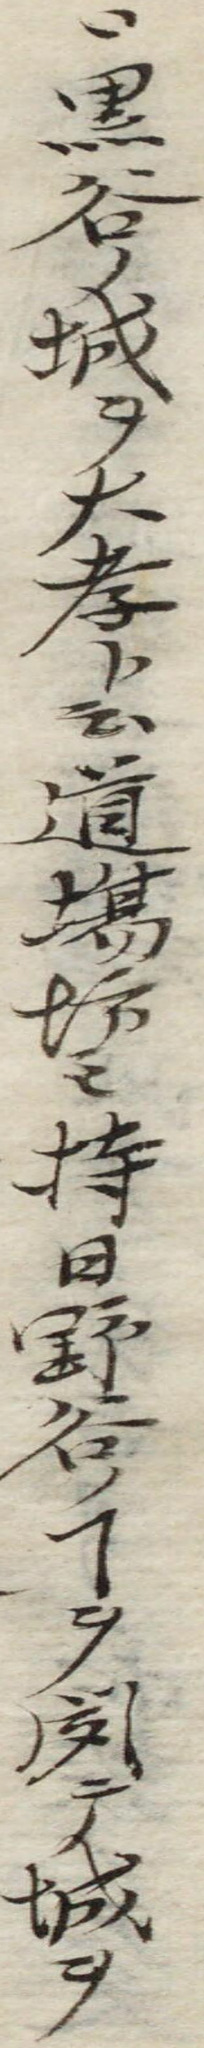〇黒谷ノ城ヲ大孝ト云道場坊モ持日野谷ノ事ヲ聞テ城ヲ
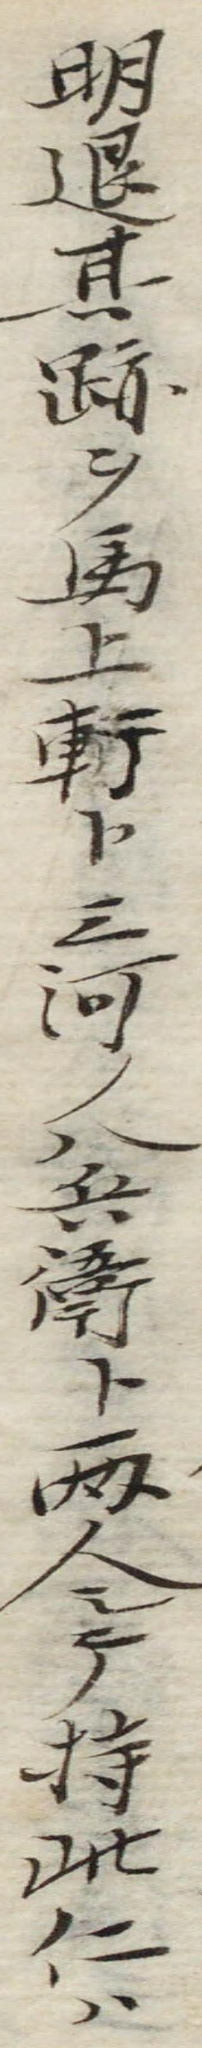明退其跡ヲ馬上軒ト三河ノ八兵衛ト両人シテ持此仁ハ
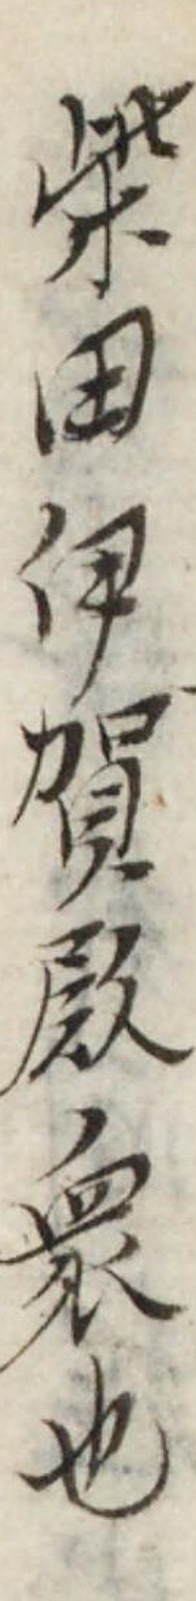柴田伊賀殿衆也
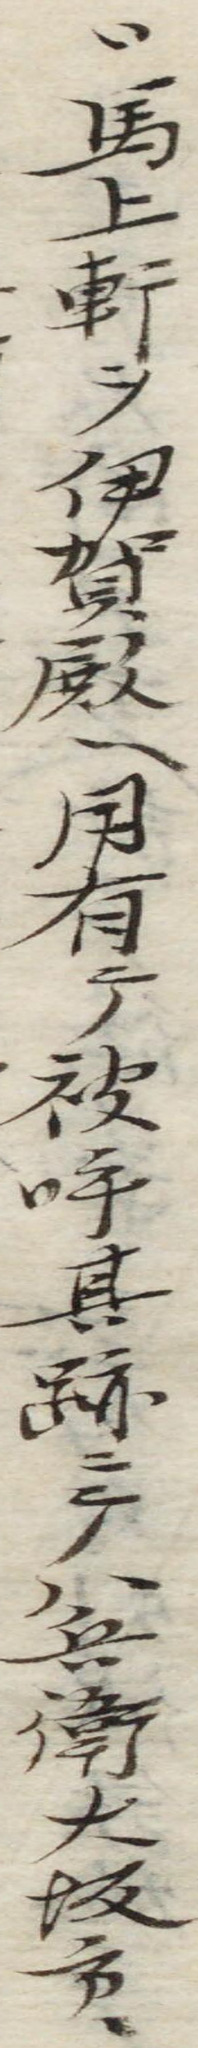〇馬上軒ヲ伊賀殿ヘ用有テ被呼其跡ニテ八兵衛大坂方ニ
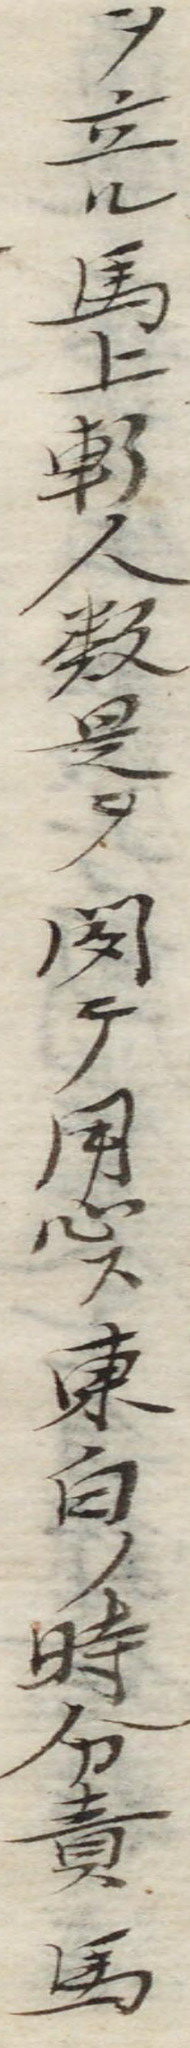ヲ立ル馬上軒人数是ヲ聞テ用心ス東白ノ時分責馬
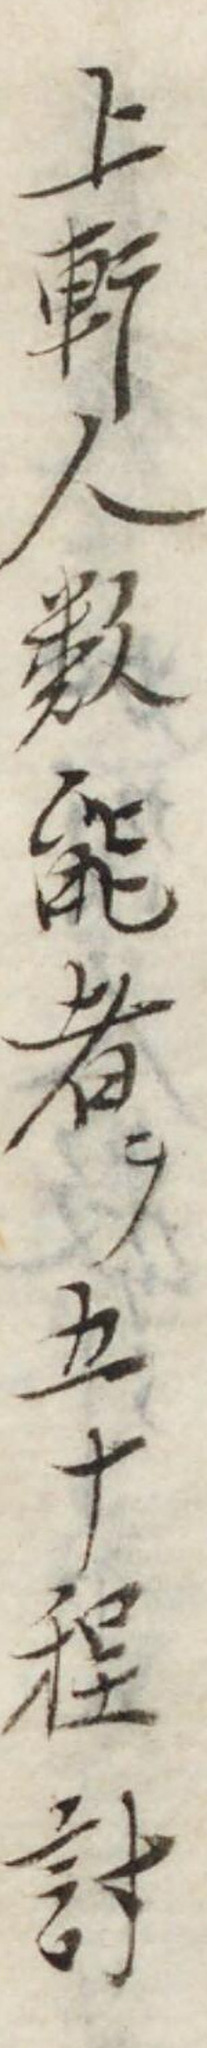上軒人数能者ヲ五十程討
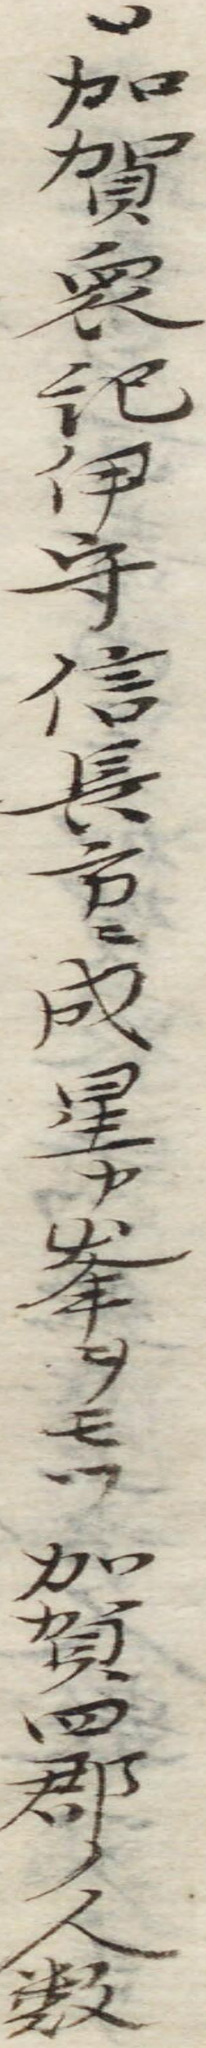〇加賀衆紀伊守信長方ニ成星ヵ峯ヲモツ加賀四郡ノ人数
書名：聞見雑録
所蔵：Ishikawa Prefectural Library
